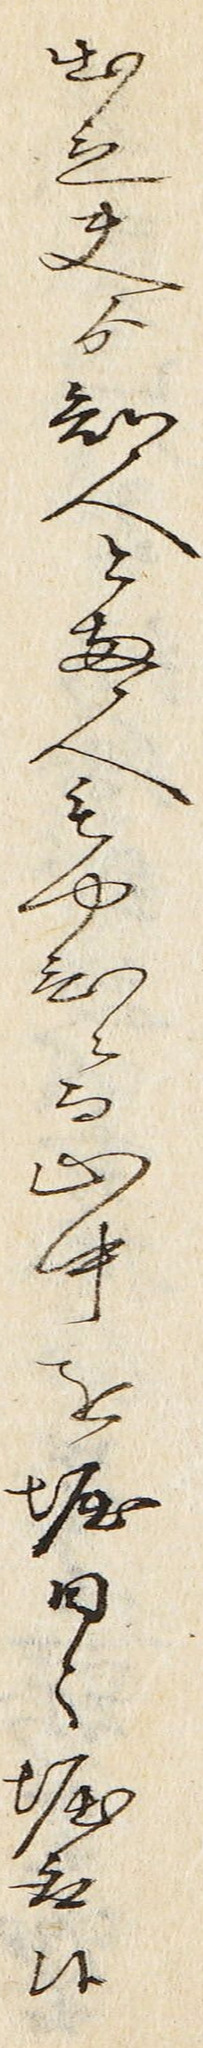出立夫ゟ知人と両人もゆひに而山中を堀日々堀取候
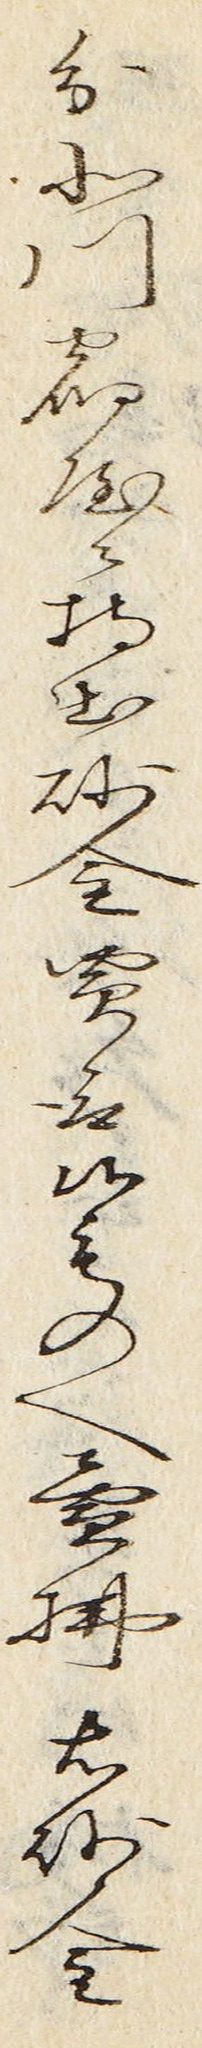分北川宿屋に持出砂金買取候ものへ売掛右砂金
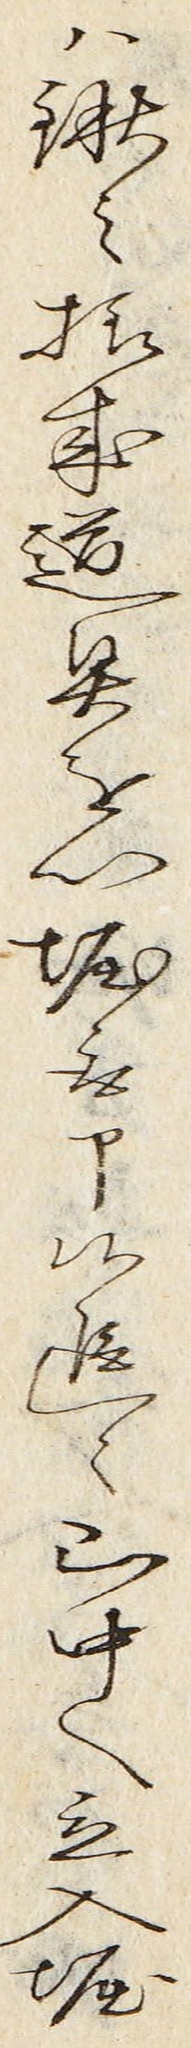は鍬之様成道具を以堀取申候追々山中へ立入堀
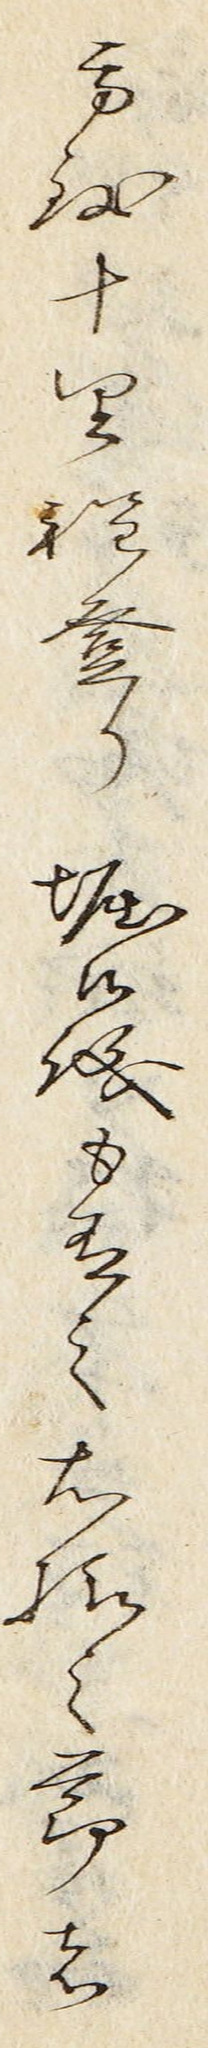方致十里程登り堀候儀も有之右様之節は
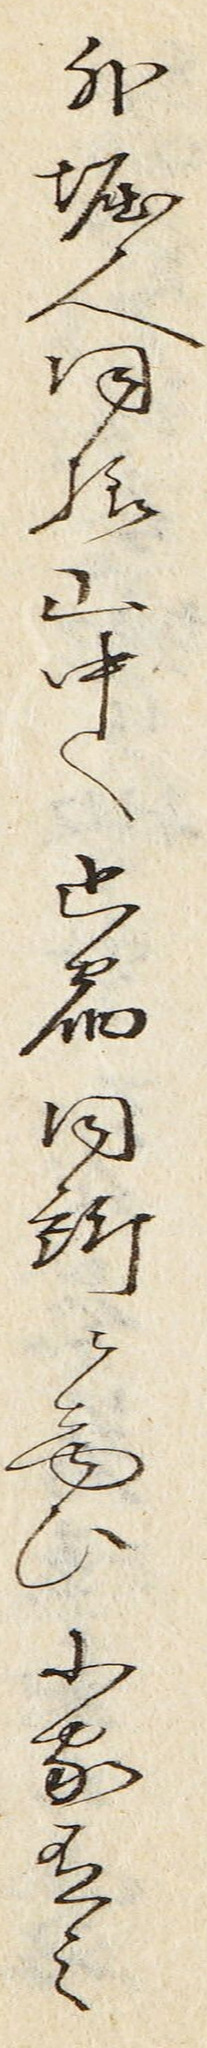外堀人同様山中へ止宿同所に商ひ小家有之
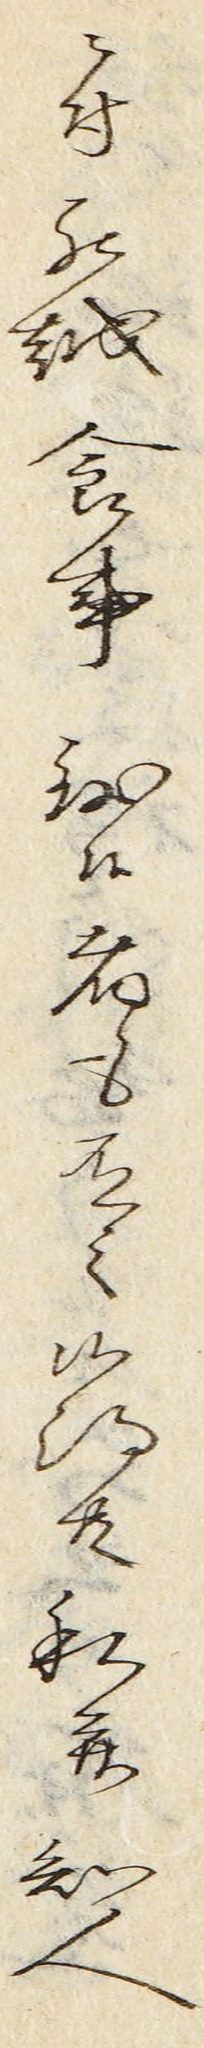に付罷越食事致候者も有之候得共私并知人
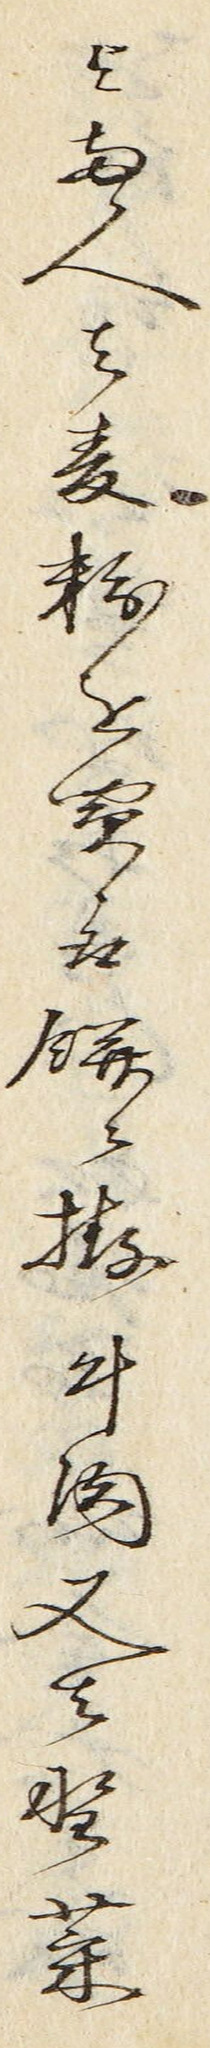与両人は麦粉を買取餅に拵牛肉又は野菜

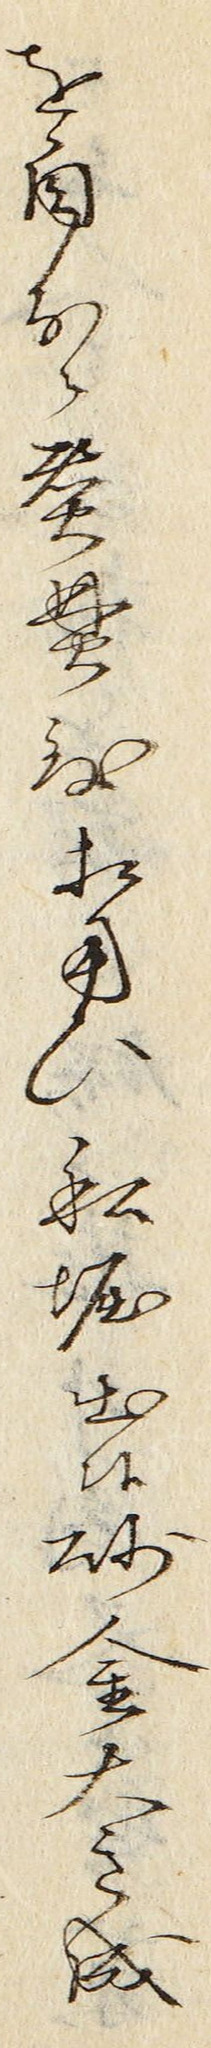を自分て煮費致相用ひ私堀出候砂金大き成
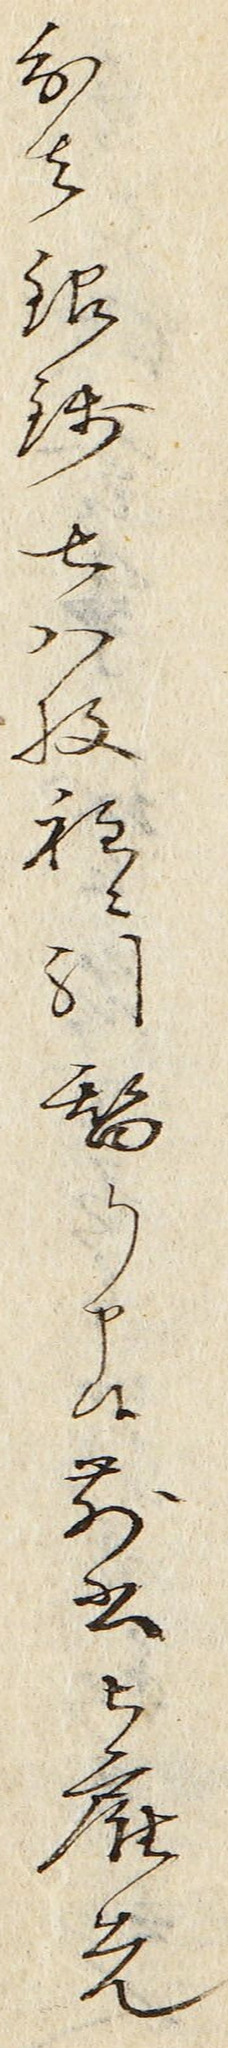分は銀銭七八枚程に引替り申候前書被雇先
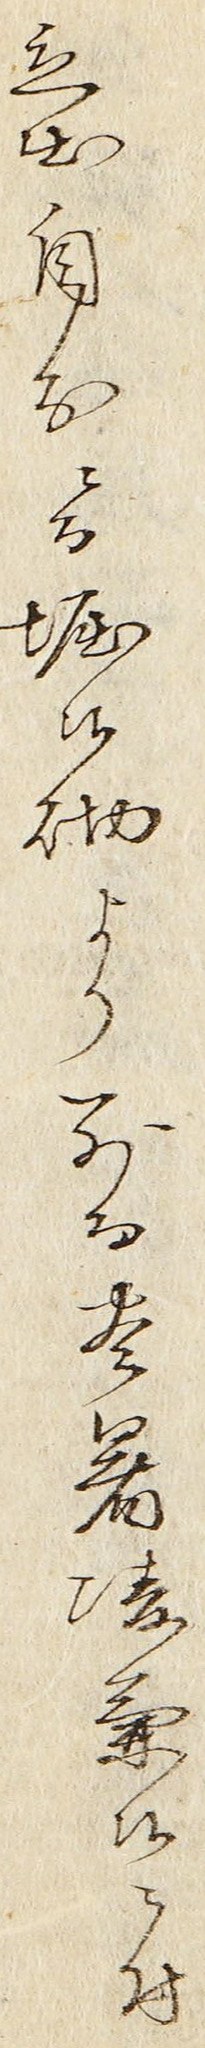立出自分に而堀候砌より別而昼暑凌兼候に付
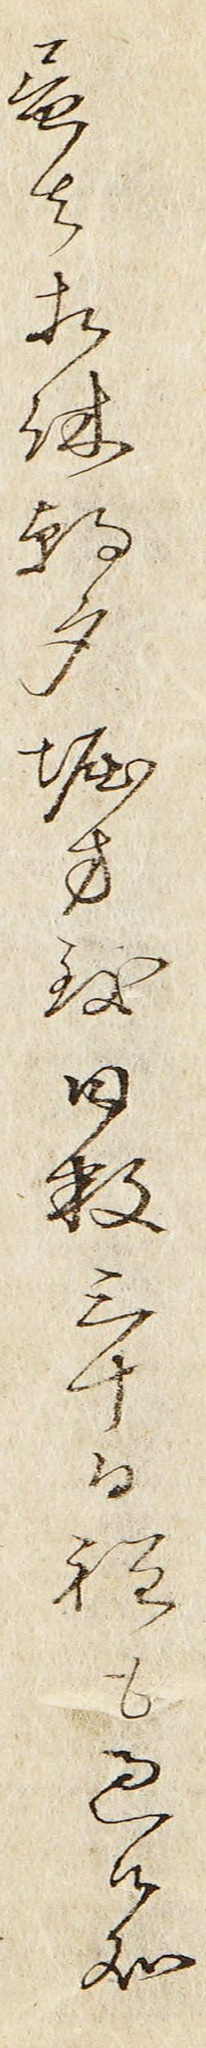昼は相休朝夕掘方致日数三十日程も過候処
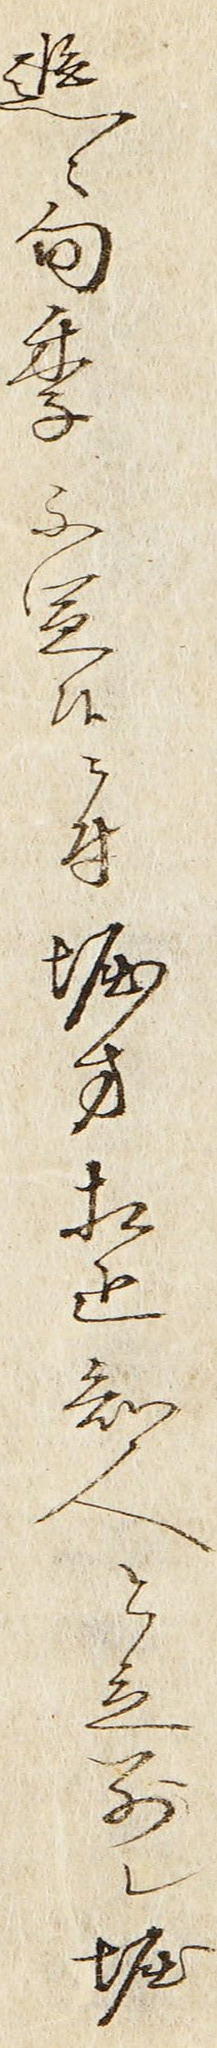追々旬季不宜候に付掘方相止知人と立別れ堀
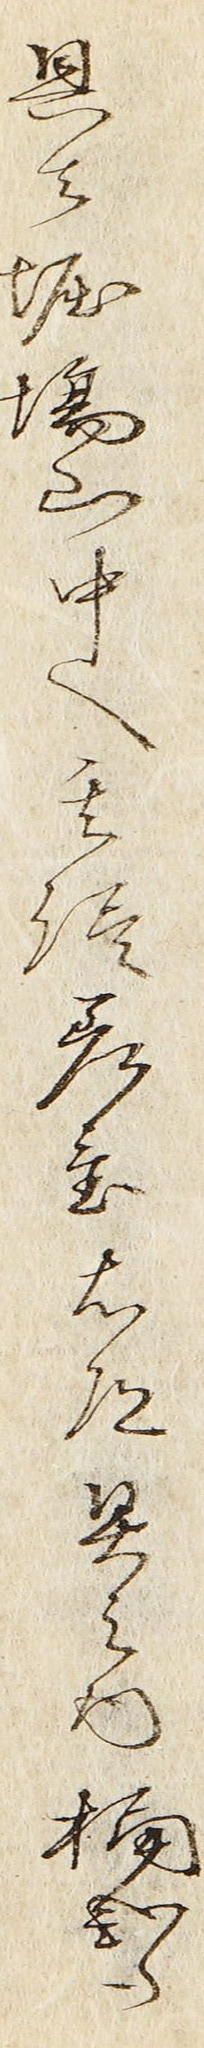具は堀場山中へ其侭差置右道具之内桶弐つ
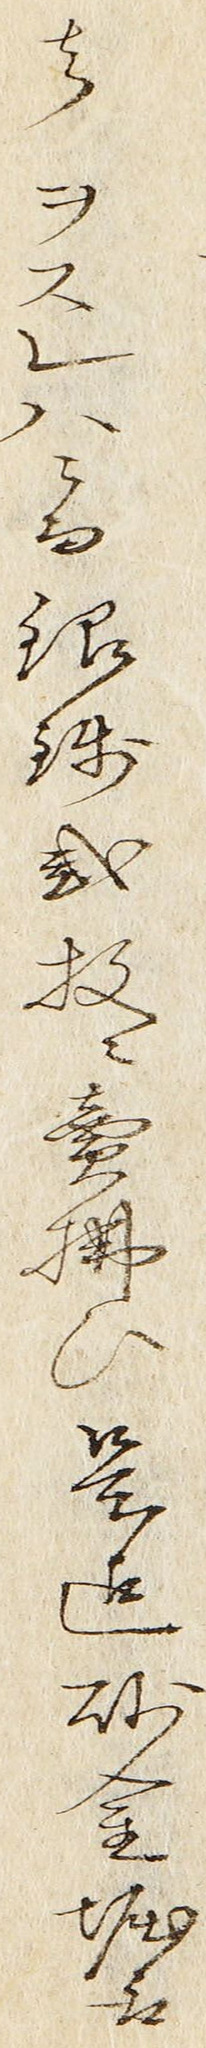はヲスレハに而銀銭弐枚に売払ひ是迄砂金掘取
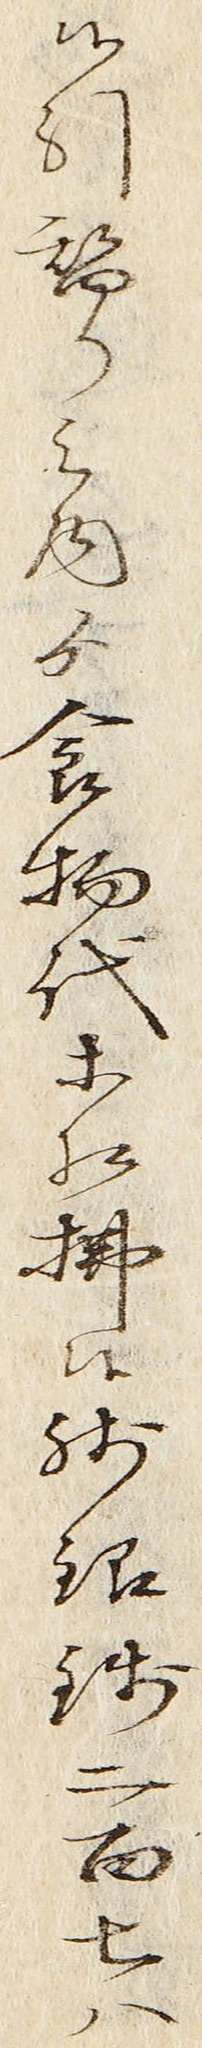候引替り之内ゟ食物代等相払候残銀銭二百七八
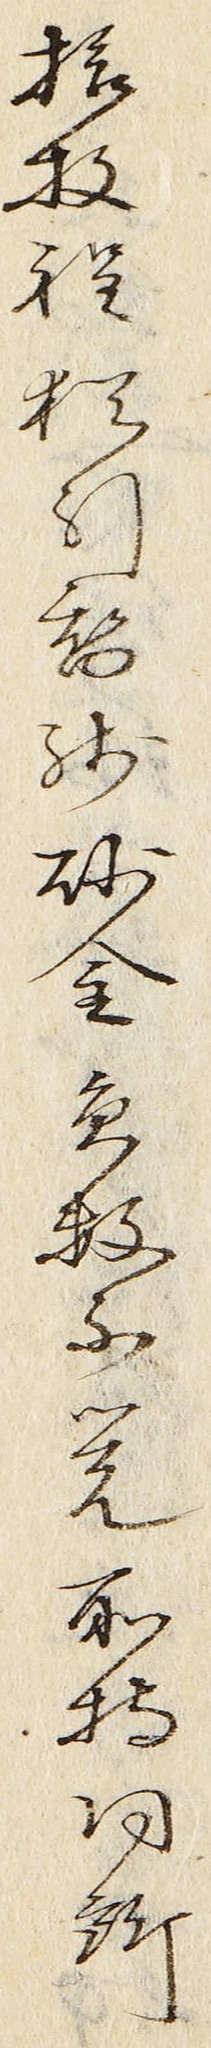拾枚程猶引替残砂金員数不覚所持同所
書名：土佐中浜万次郎漂流記
